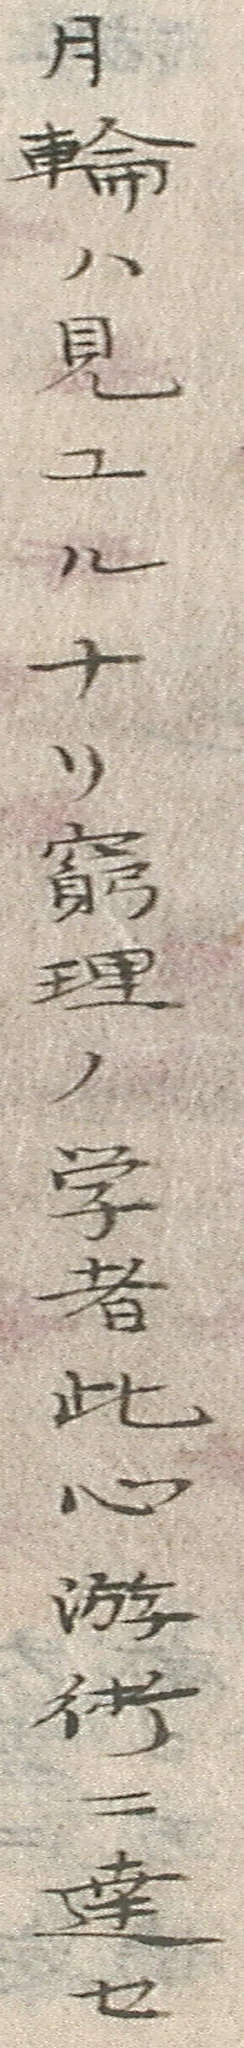月輪ハ見ユルナリ窮理ノ学者此心游術ニ達セ
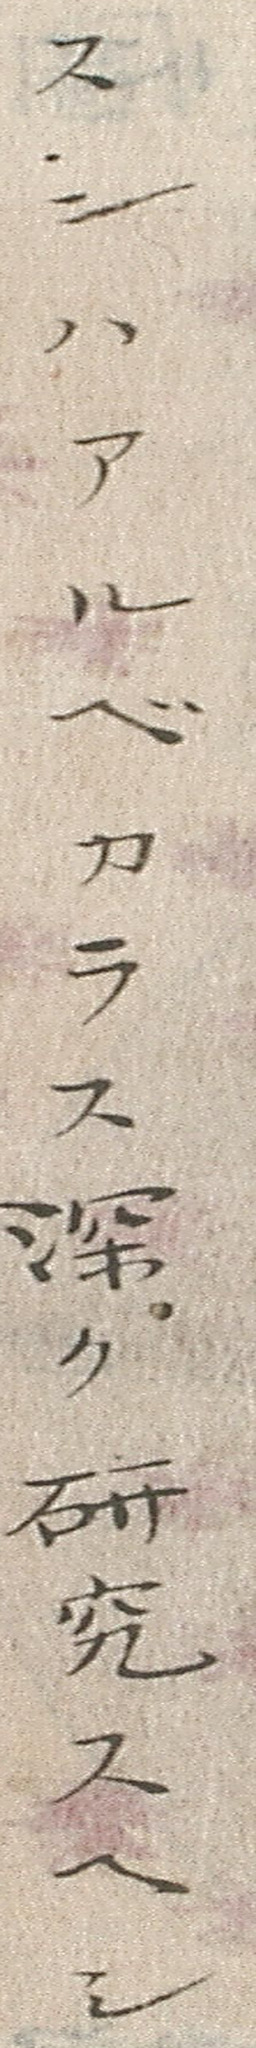スンハアルベカラス深ク研究スベシ
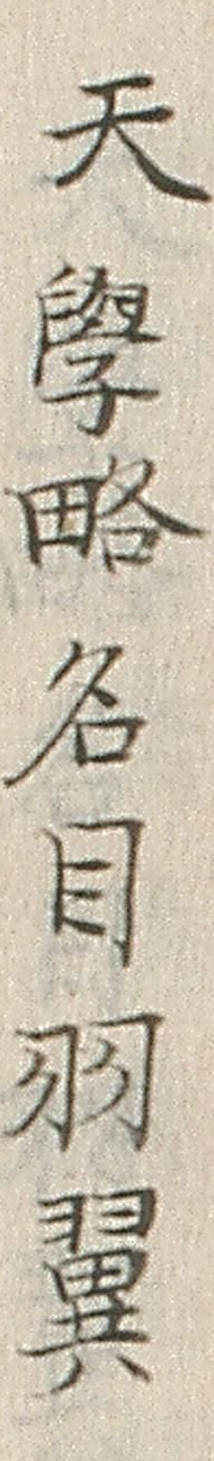天学略名目羽翼
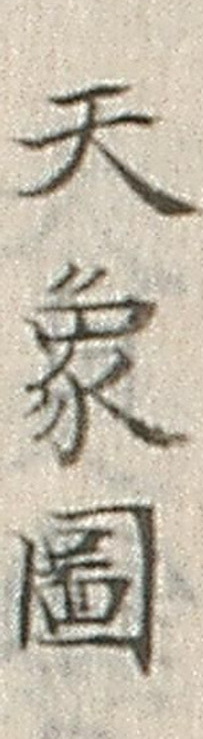天象図

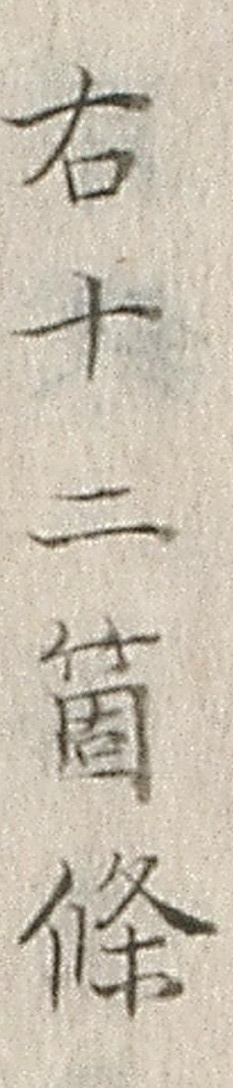右十二箇条
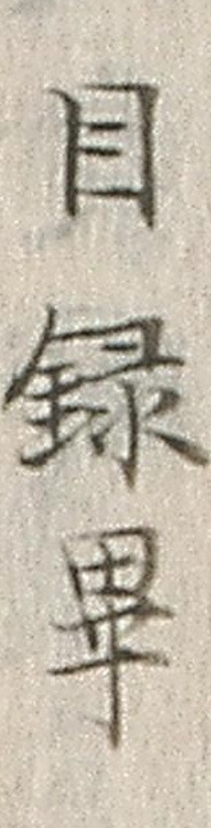目録畢
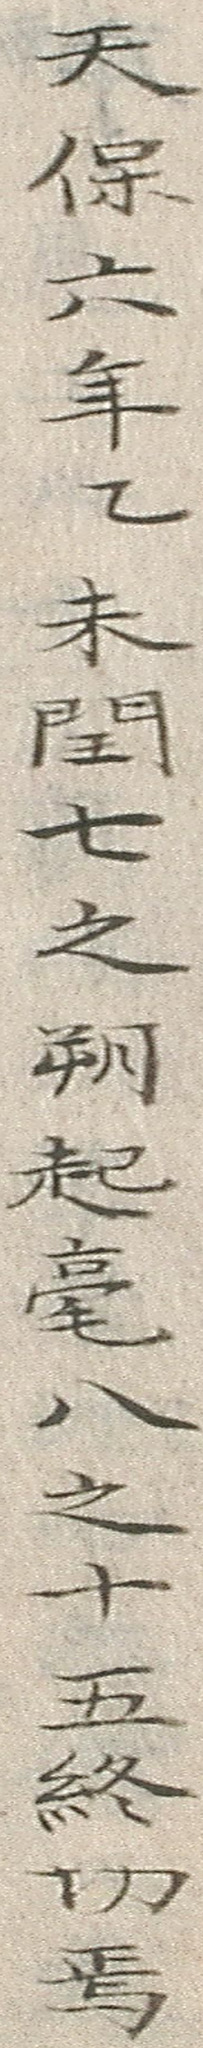天保六年乙未閏七之朔起毫八之十五終切焉
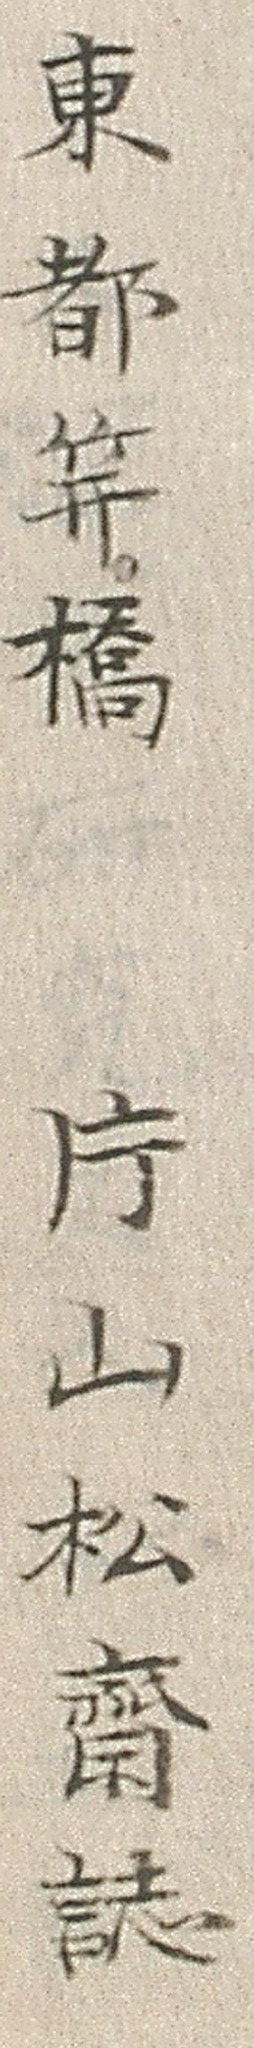東都笄橋片山松齋誌
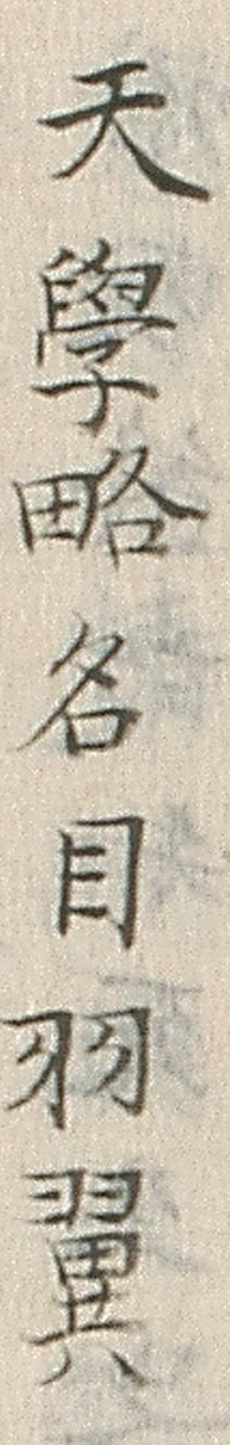天学略名目羽翼
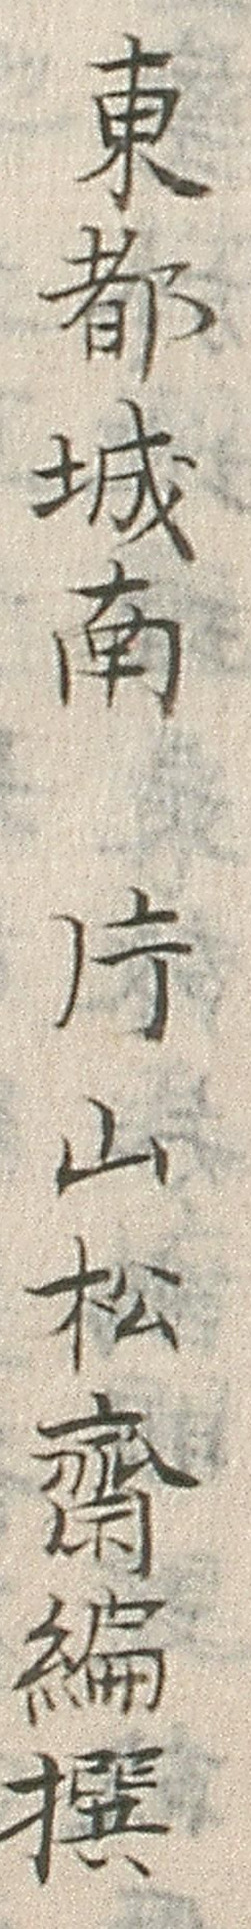東都城南片山松齋編撰
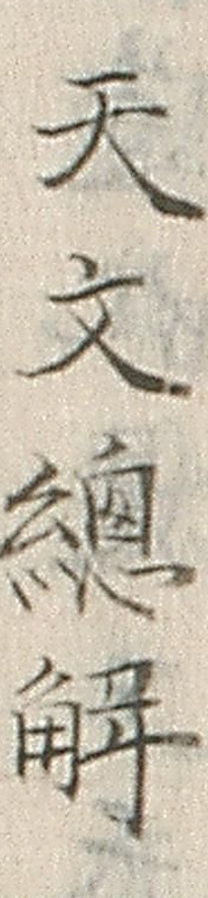天文総解
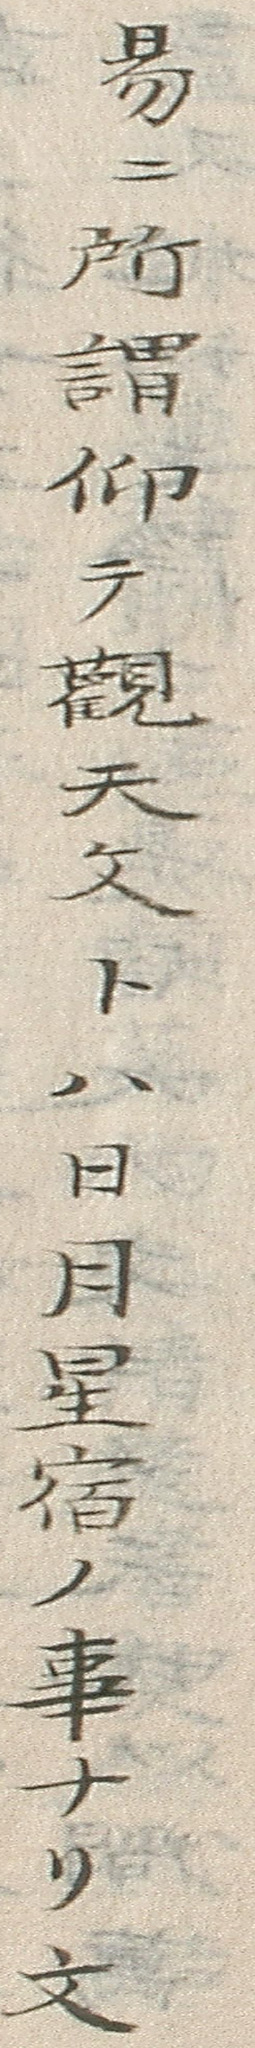易ニ所謂仰テ観天文トハ日月星宿ノ事ナリ文
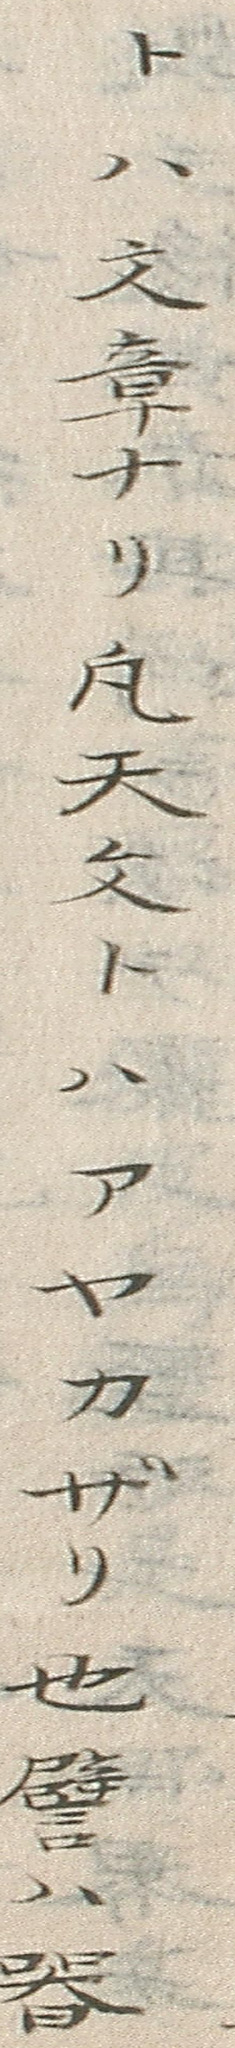トハ文章ナリ凡天文トハアヤカザリ也譬ハ器
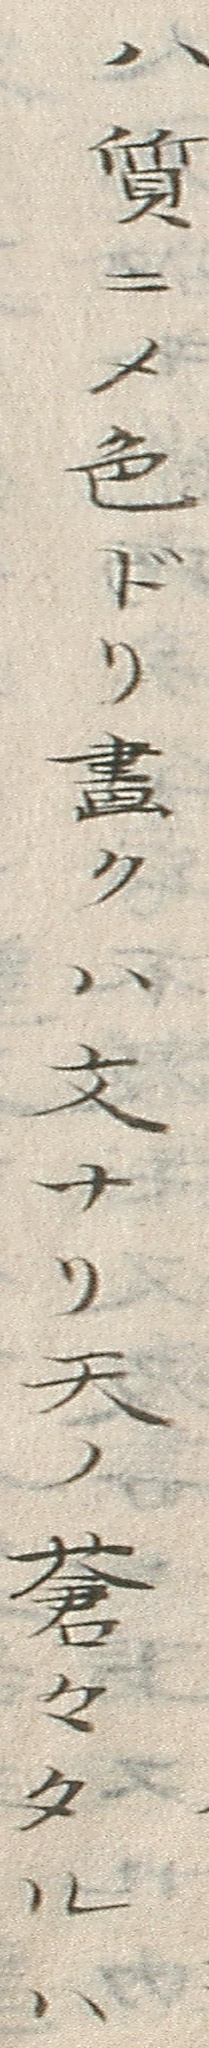ハ質ニシテ色ドリ画クハ文ナリ天ノ蒼々タルハ
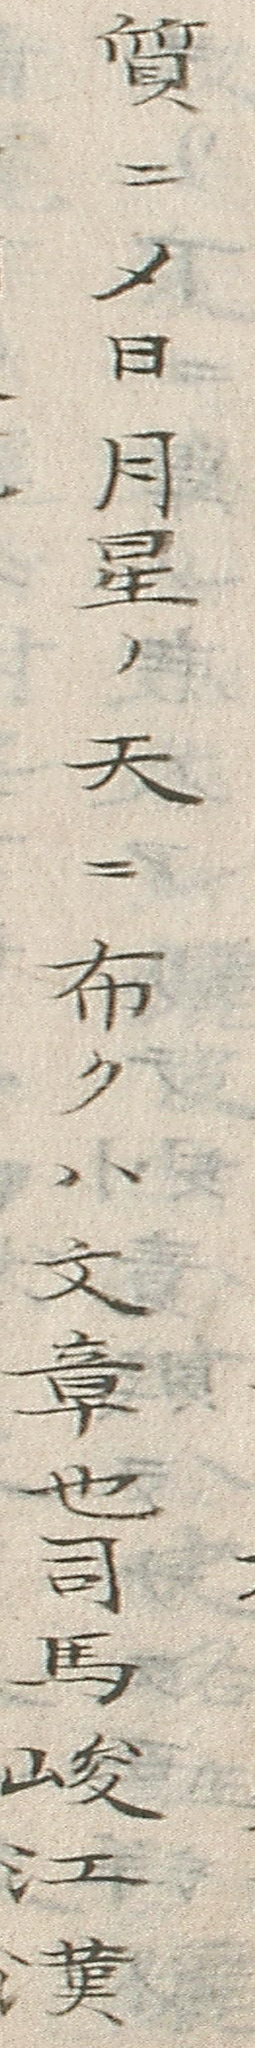質ニシテ日月星ノ天ニ布クハ文章也司馬峻江漢
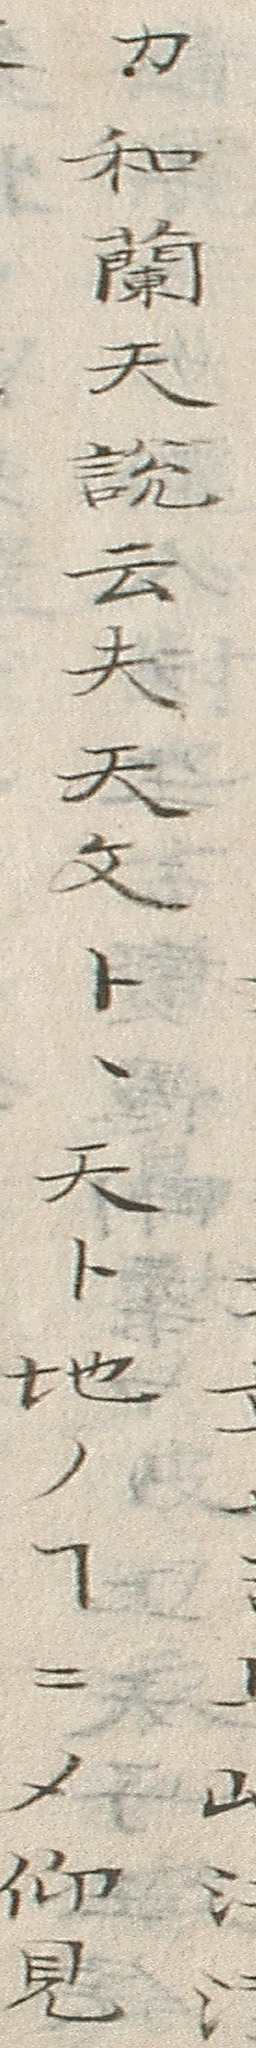カ和蘭天説云夫天文トハ天ト地ノコトニシテ仰見
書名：天學略名目羽翼　全
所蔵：東京大学地震研究所図書室 Earthquake Research Institute Library, The University of Tokyo, JAPAN
